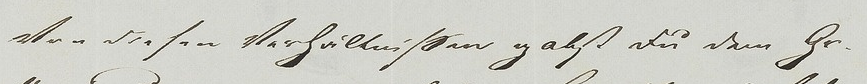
Von diesen Verhältnissen gabst Du dem Gr.
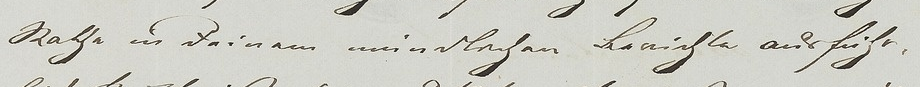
Rathe in Deinem mündlichen Berichte ausführ-
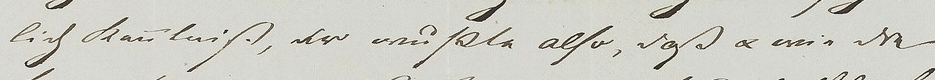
lich Kenntniß, der wußte also, daß & wie die
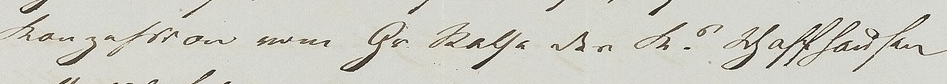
Konzession vom Gr. Rathe des KsSchaffhausen
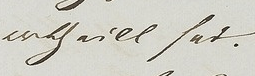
ertheilt sei.
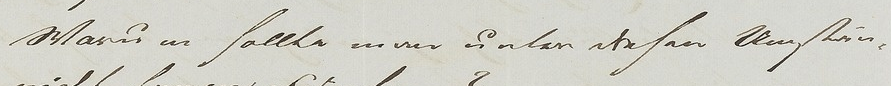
Warum sollte man unter diesen Umstän-
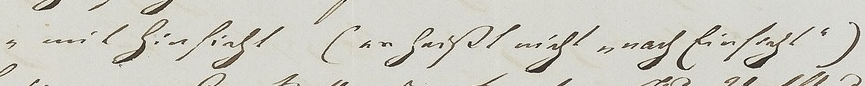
«mit Hinsicht (es heißt nicht «nach Einsicht»)
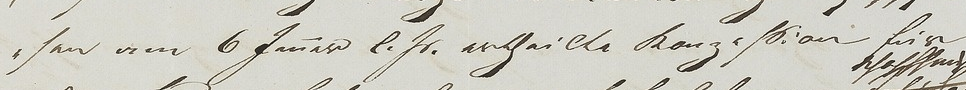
sen am 6 Jenner l. Js. ertheilte Konzession für
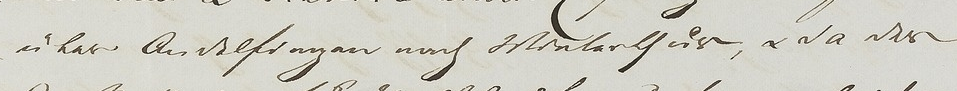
über Andelfingen nach Winterthur, & da der
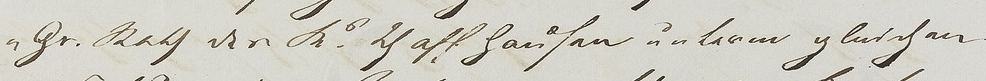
Gr. Rath des KsSchaffhausen unterm gleichen
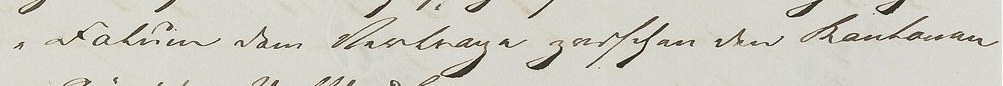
Datum dem Vertrage zwischen den Kantonen
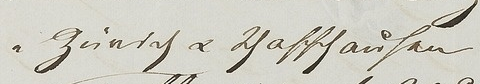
Zürich & Schaffhausen
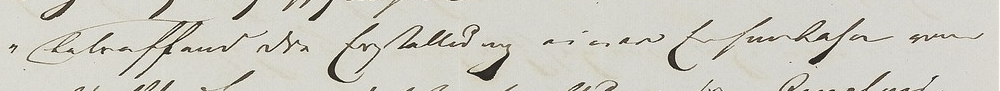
betreffend die Erstellung einer Eisenbahn von
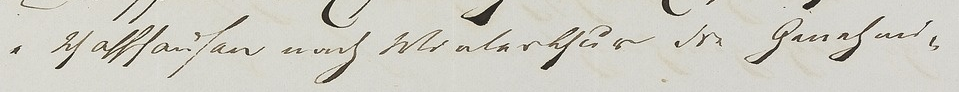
Schaffhausen nach Winterthur die Genehmi-
